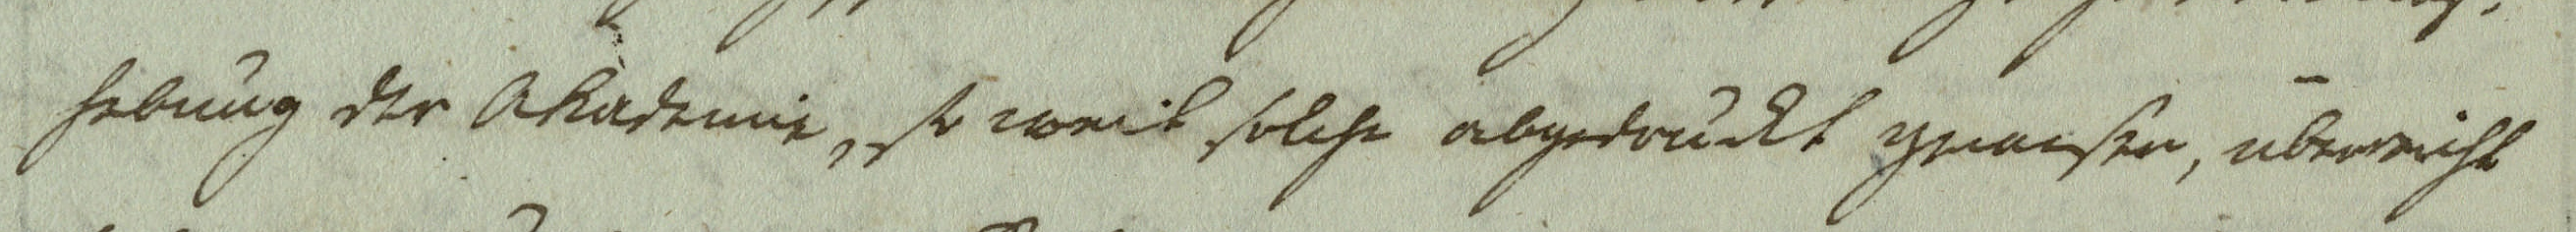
hebung der Akademie, so weit solche abgedruckt gewesen, überreicht
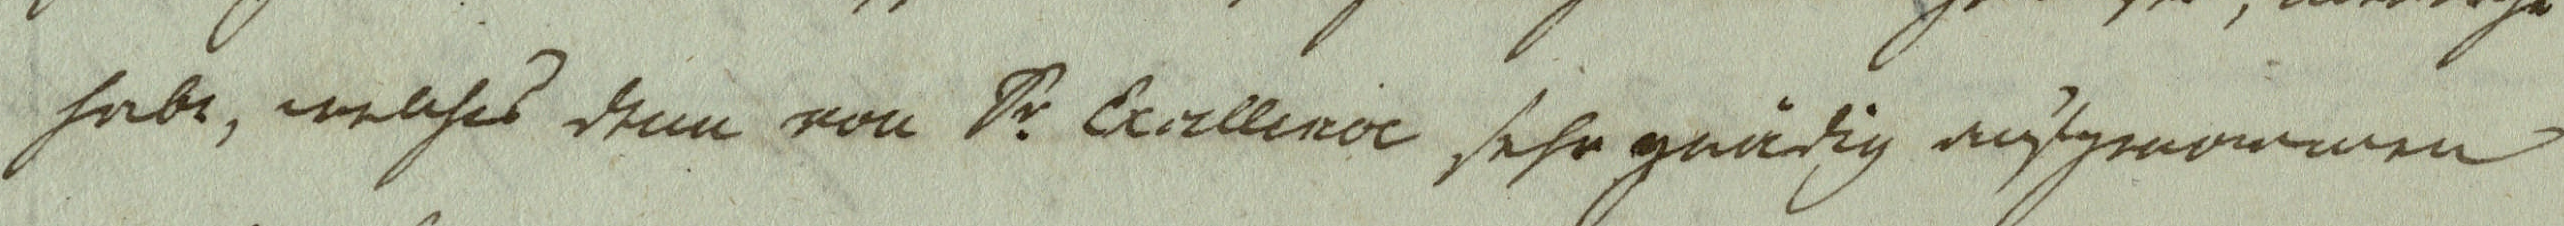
habe, welches denn von Sr. Excellence sehr gnädig aufgenommen
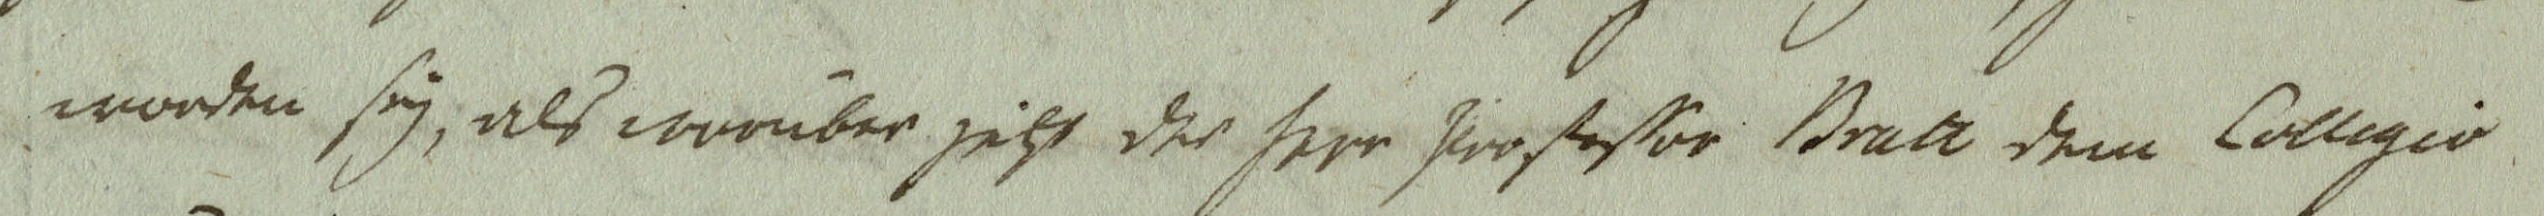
worden seÿ, als worüber jetzt der herr Professor Bratt dem Collegio
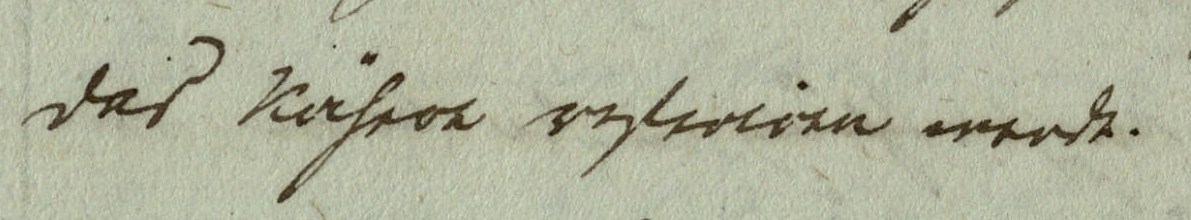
das Nähere referiren werde.
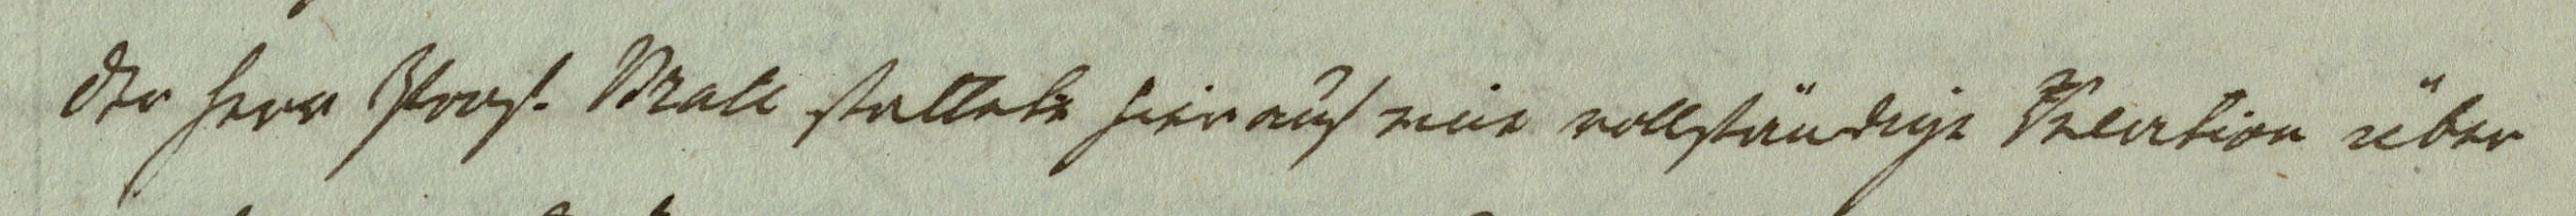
Der herr Prof. Bratt stattete hierauf eine vollständige Relation über
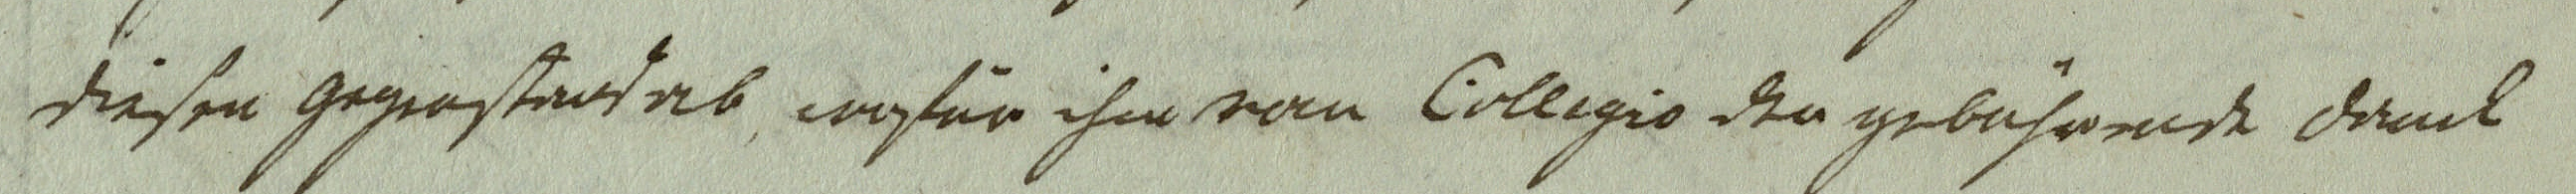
diesen Gegenstand ab, wofür ihm vom Collegio der gebührende Danck
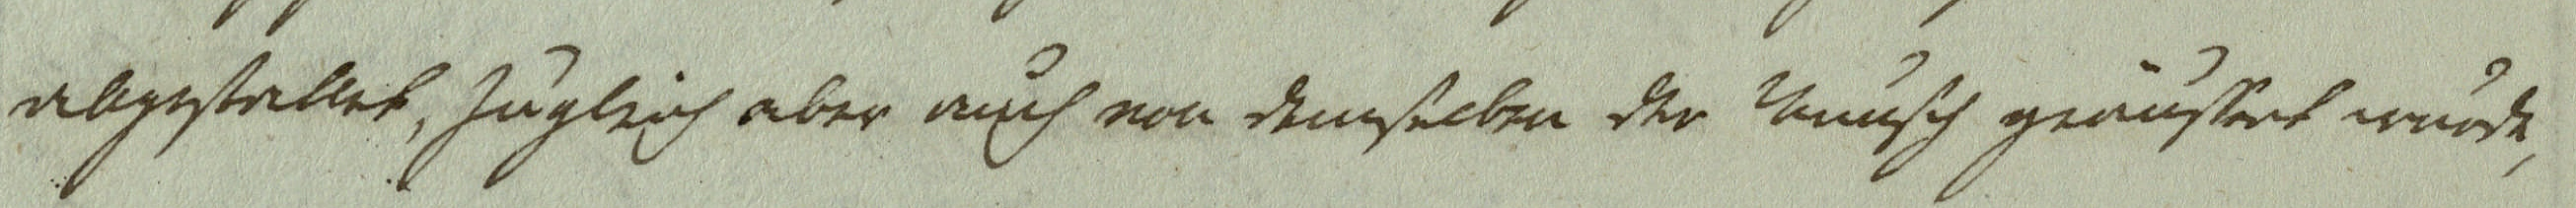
abgestattet, zugleich aber auch von demselben der Wunsch geäussert wurde,
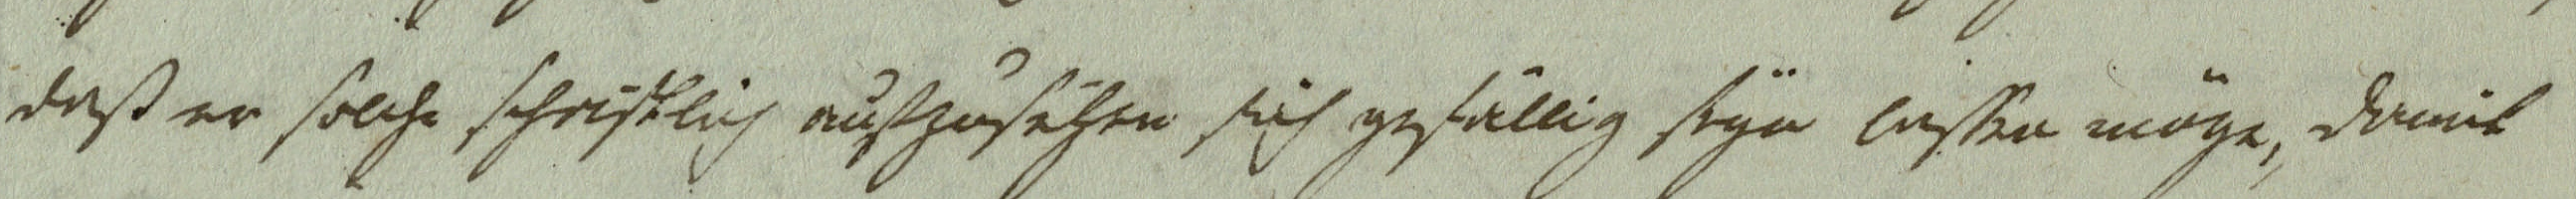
daß er solche schriftlich aufzusetzen sich gefällig seÿn lassen möge, damit
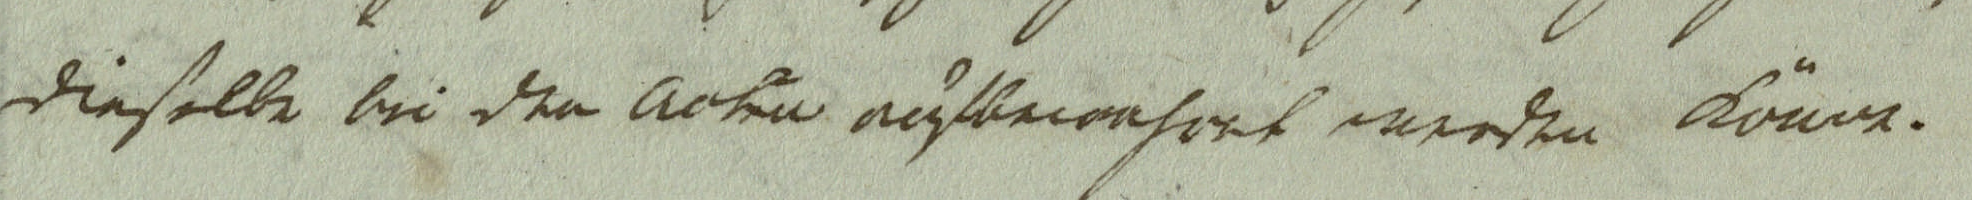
dieselbe bei den Acten aufbewahret werden könne.
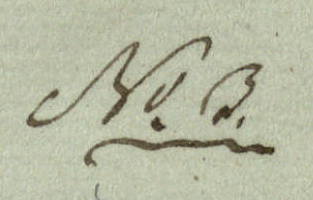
Nº. 3.
